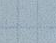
Freund
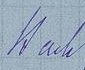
spreche
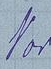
es
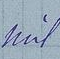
wieder
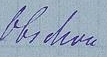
besser
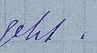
geht.
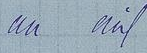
an auf
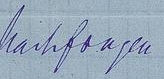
Nachfragen
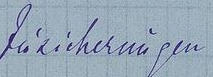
Zusicherungen
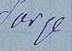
erhielt,
